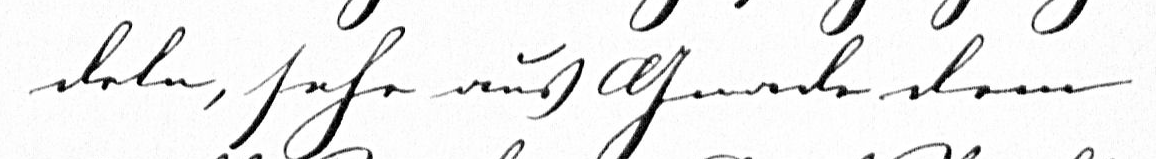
deln, sehr aus Gnade dem
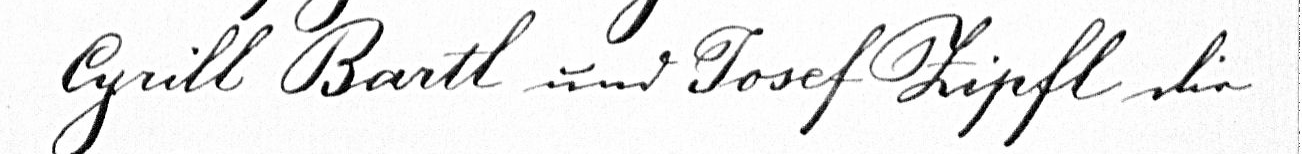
Cyrill Bartl und Josef Zipfl die
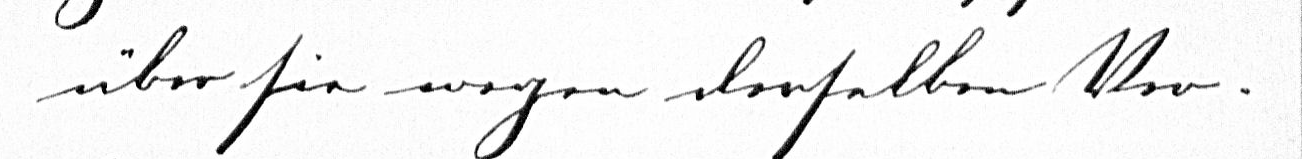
über sie wegen derselben Ver¬
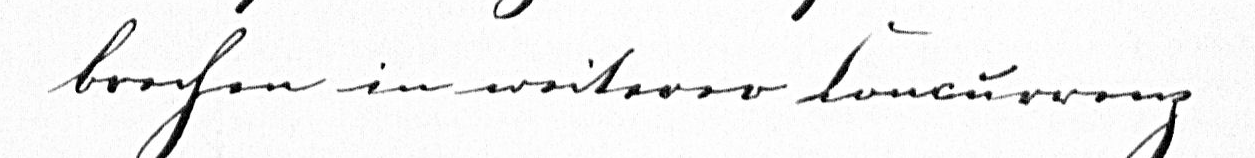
brechen in weiterer Concurrenz
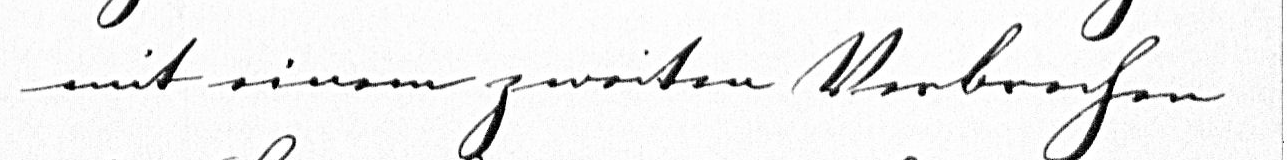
mit einem zweiten Verbrechen
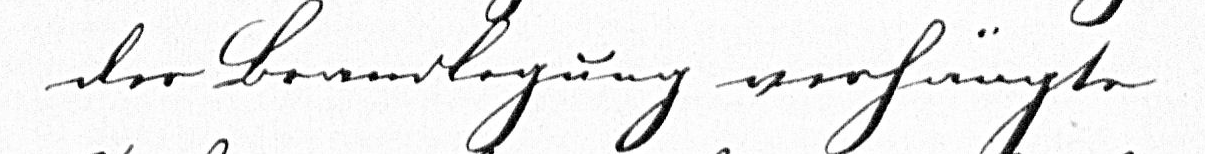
der Brandlegung verhängte
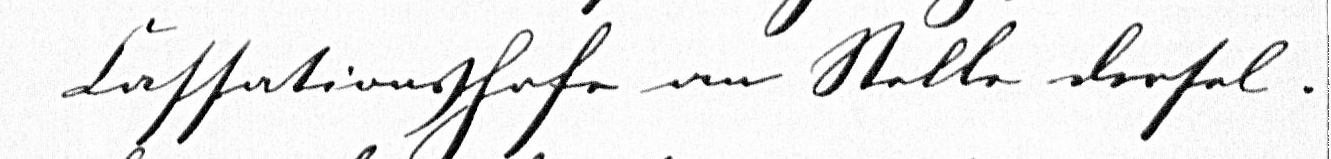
Cassationshofe an Stelle dersel¬
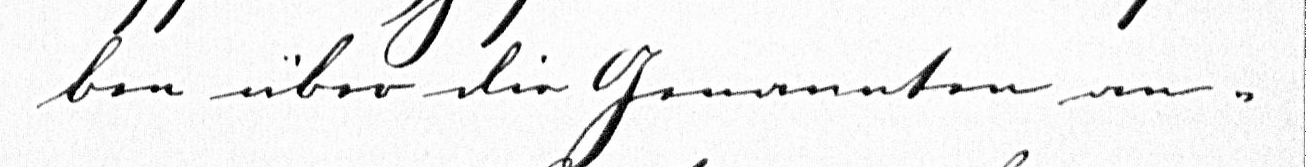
ben über die Genannten an¬
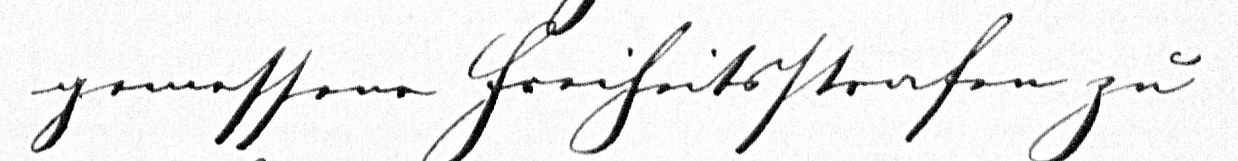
gemessene Freiheitsstrafen zu
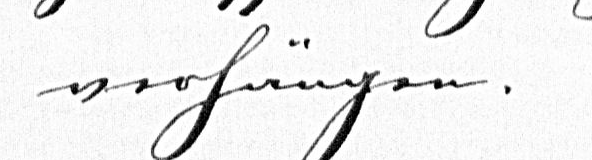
verhängen.
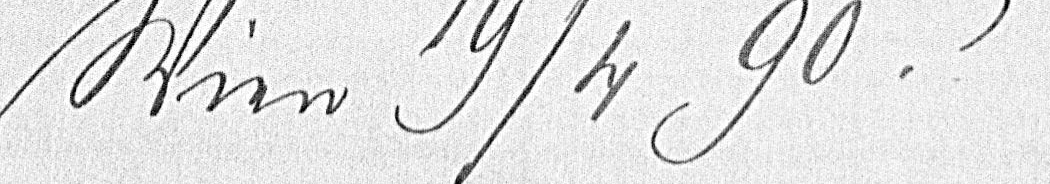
Wien 19/4 90.
